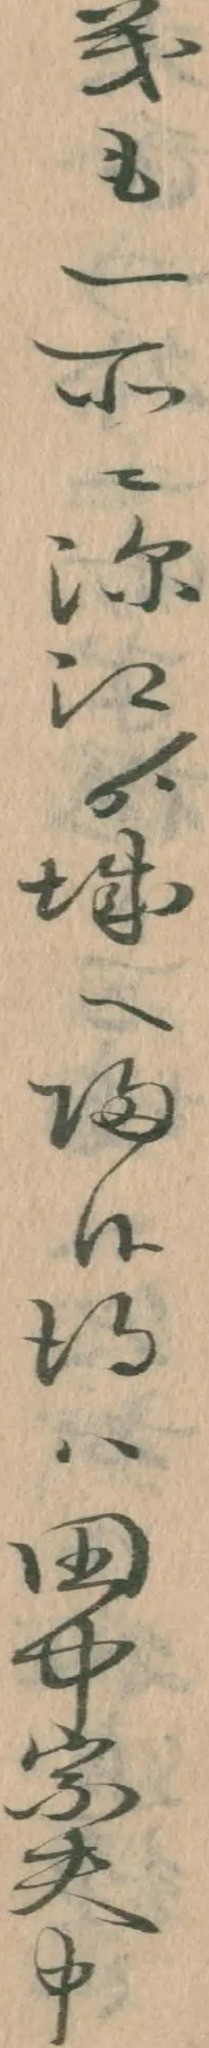義も一所に深江ゟ城へ帰候得は田中宗夫申
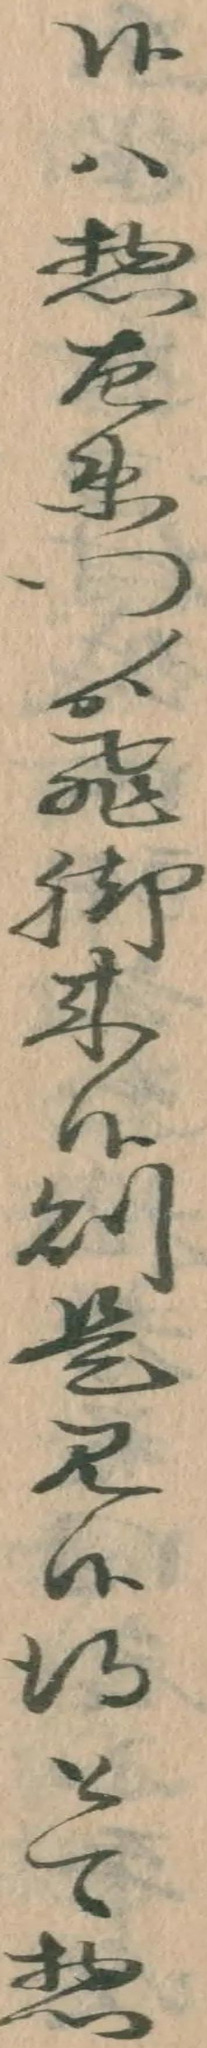候は惣左衛門ゟ飛脚来候則是見候得とて惣
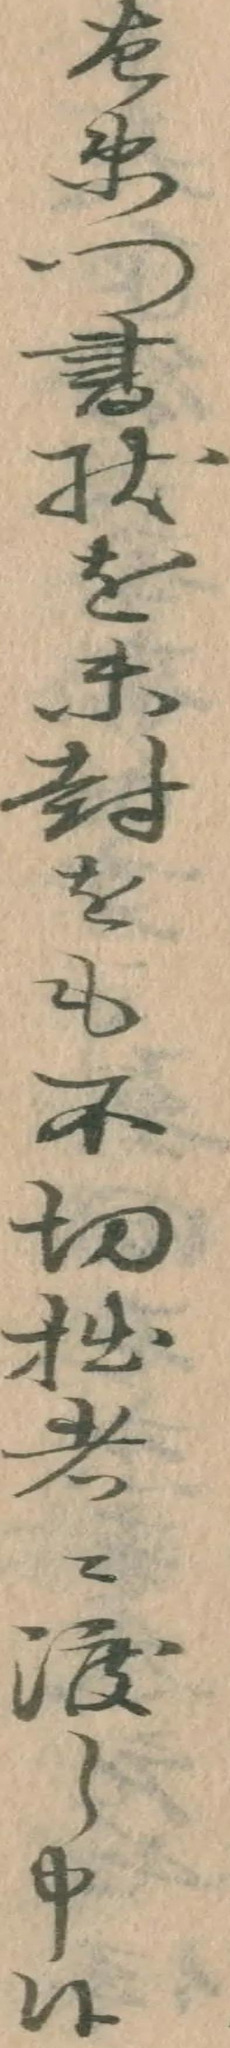左衛門書状を未封をも不切拙者に渡し申候
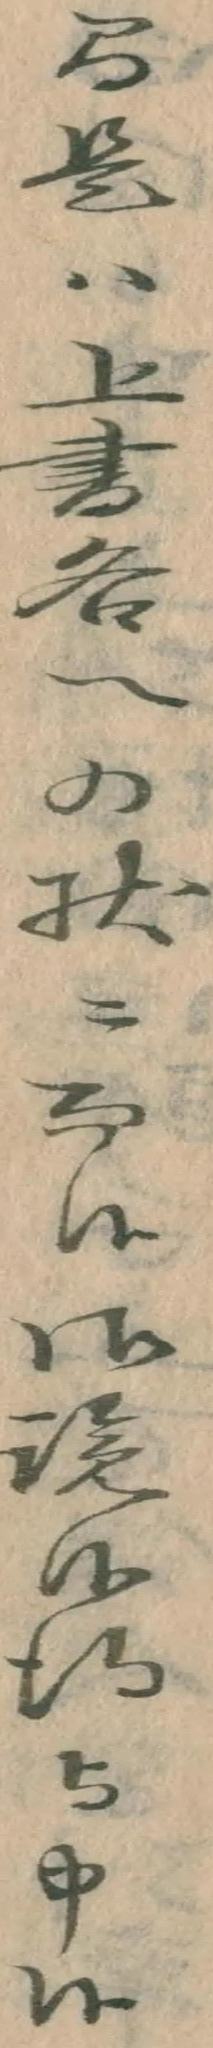間是は上書各への状に而候御覧候得与申候
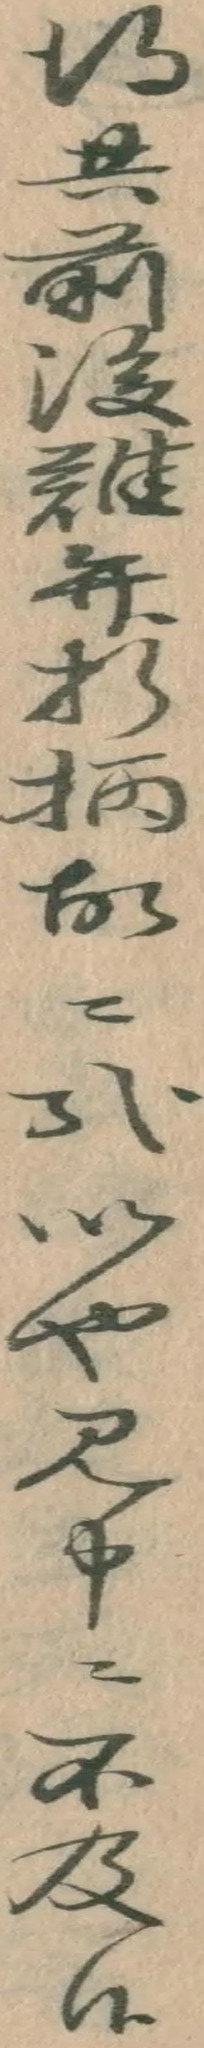得共前後難弁折柄故に哉いや見申不及候
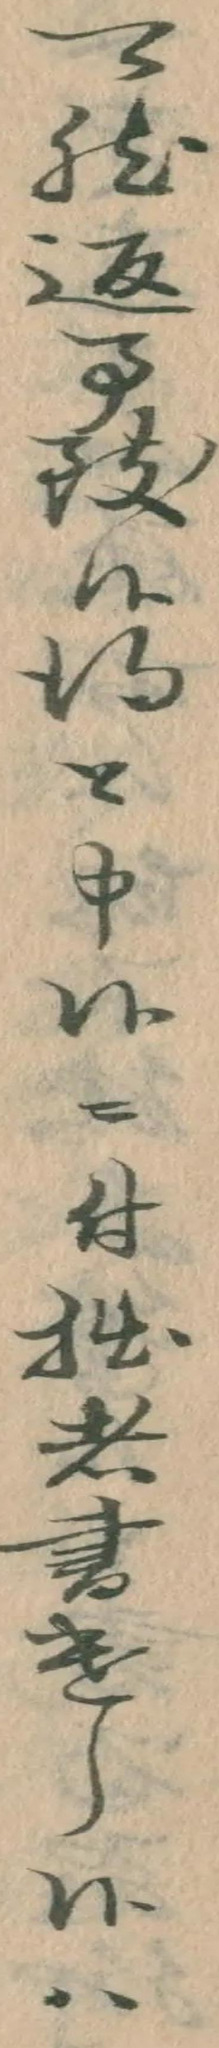可然返事致候得と申候に付拙者書遺し候は
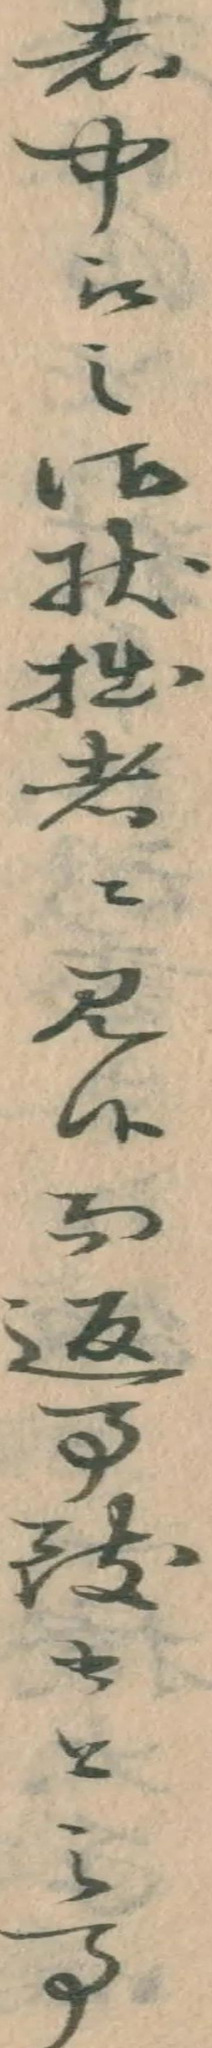老中え之御状拙者に見候而返事致せと之事
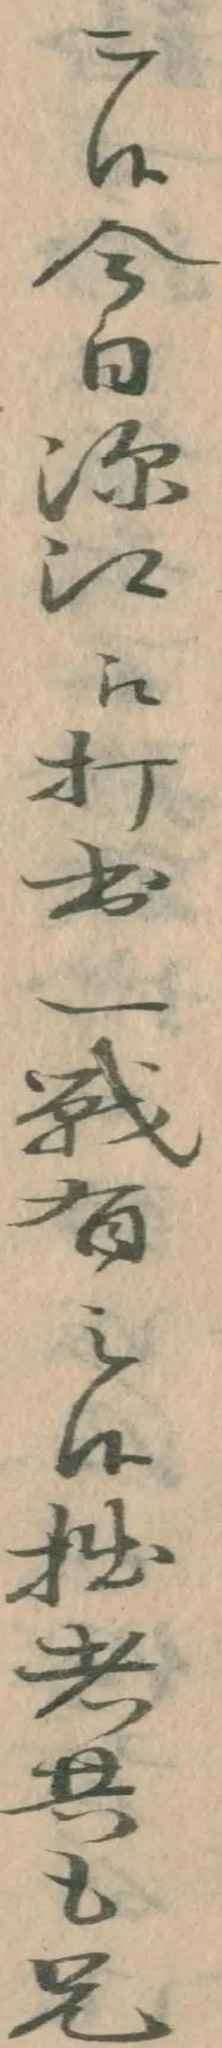に候今日深江え打出一戦有之候拙者共も兄
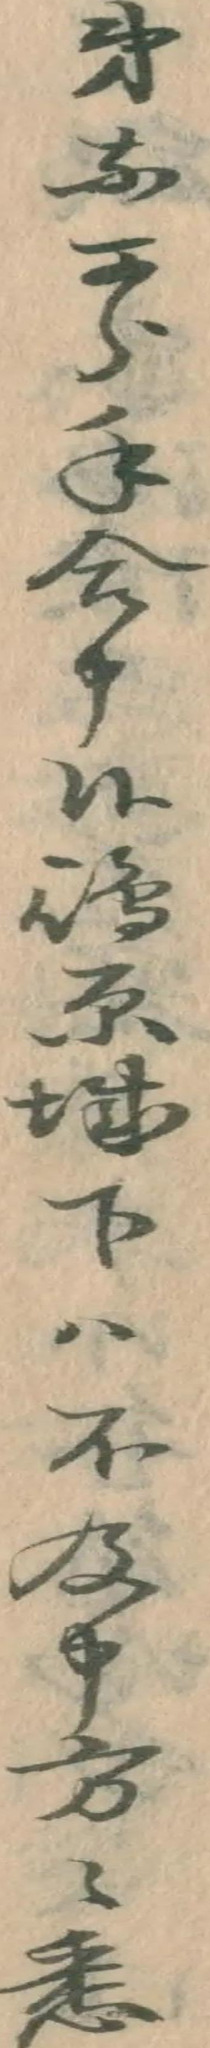弟なから手合申候島原城下は不及申方々悉

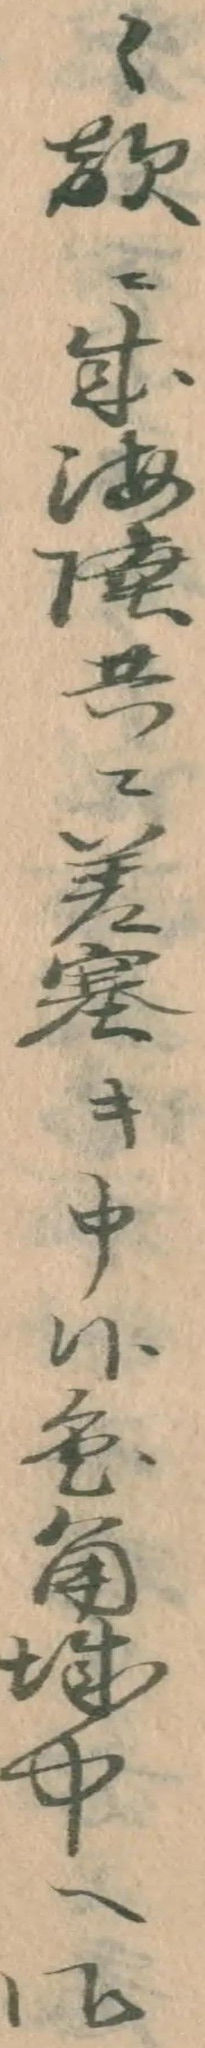く敵に成海陸共に差塞き申候兎角城中へ御
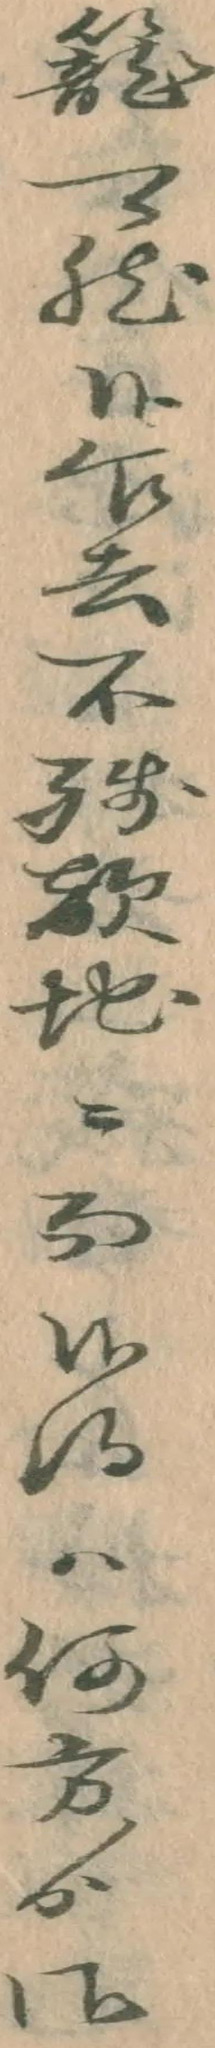籠可然候乍去不残敵地に而候得は何方ゟ御
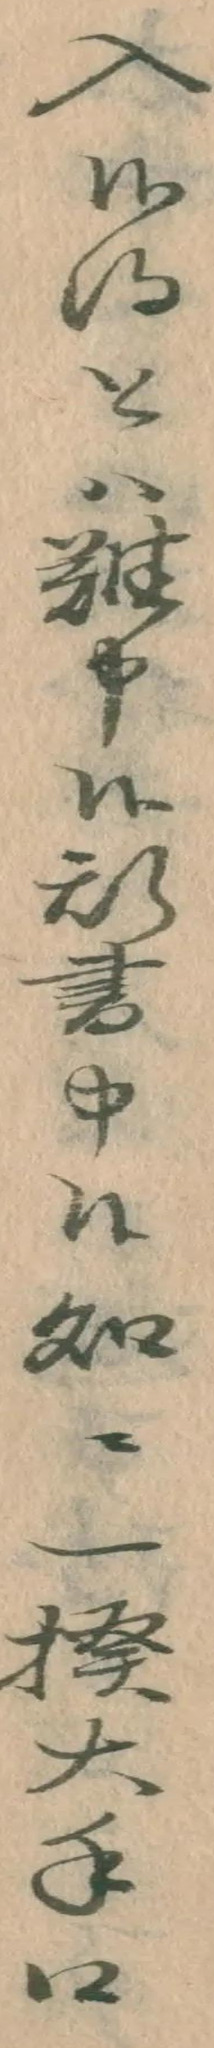入候得とは難申候斯所申候処に一揆大手口
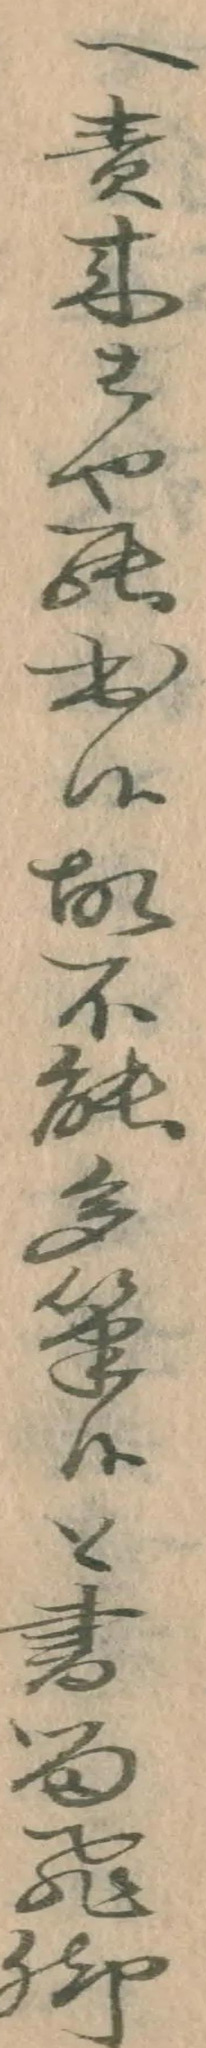へ責来はや能出候故不能多筆候と書留飛脚
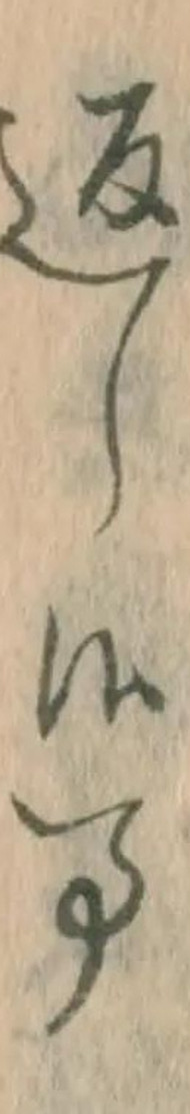返し候事
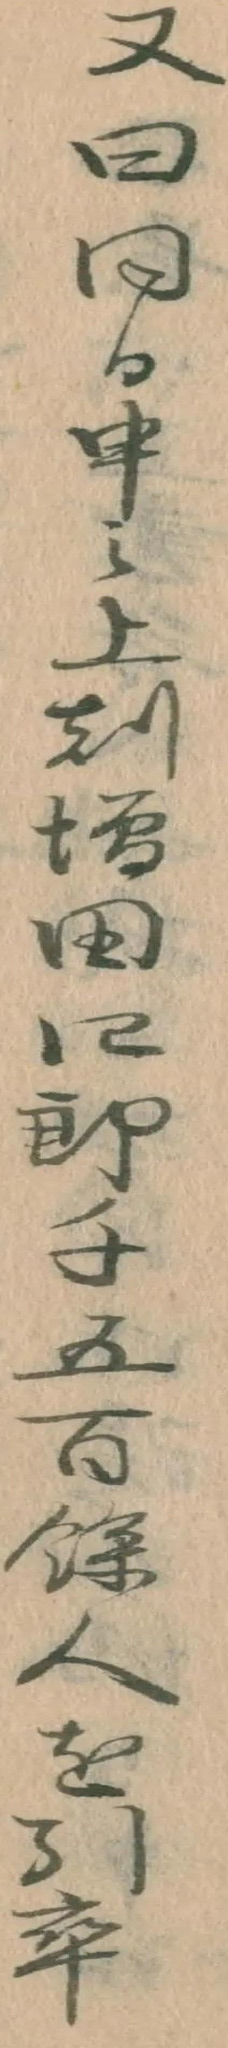又日同日申之上刻増田四郎千五百余人を引卒
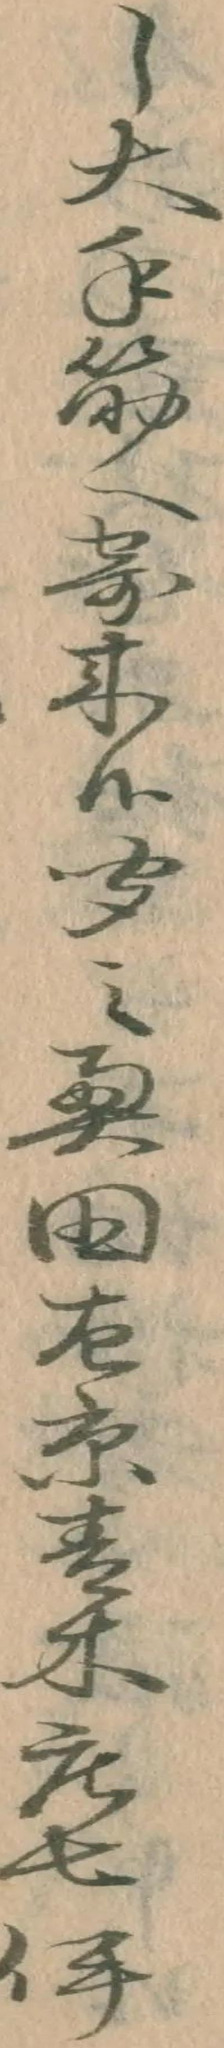し大手筋へ寄来候聞之奥田左京青木庄七伊
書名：切支丹御退治記 49巻. [1]
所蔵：国立国会図書館 National Diet Library, JAPAN
